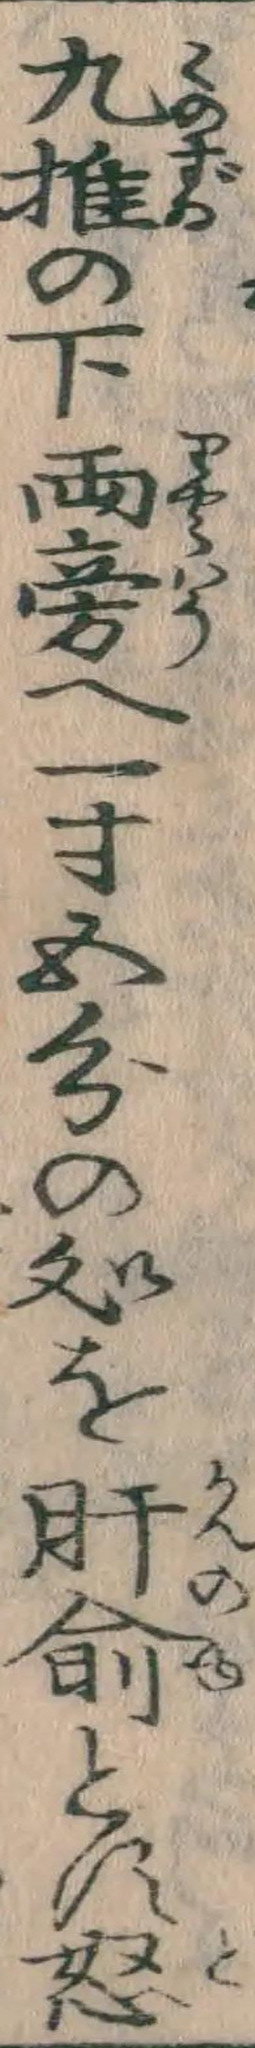九椎の下両旁へ一寸五分の処を肝兪とす怒
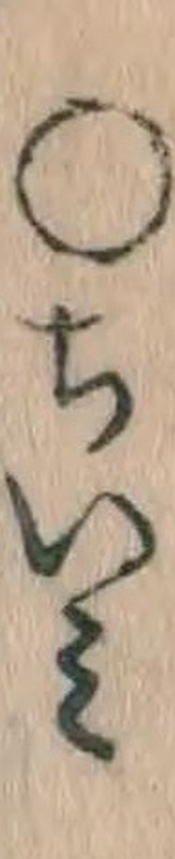○ちいみ
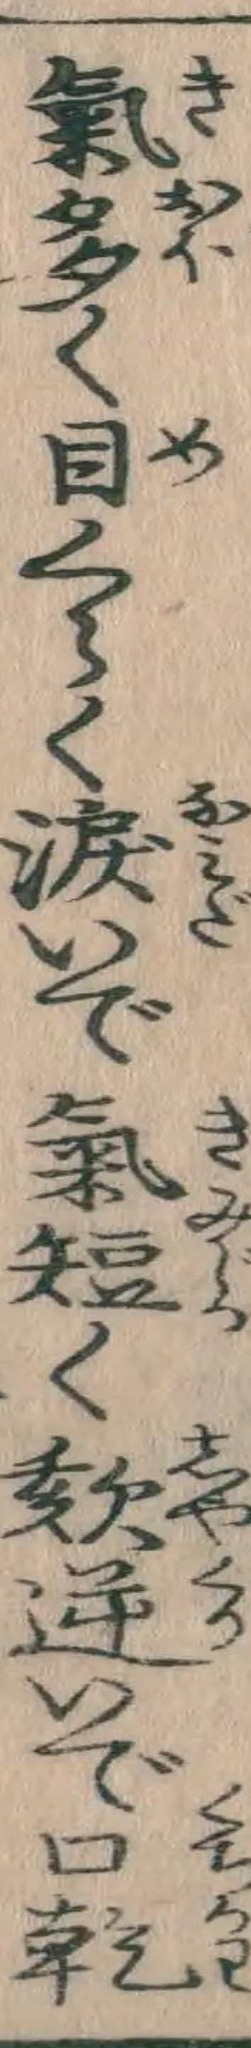気多く目くらく涙いで気短く欬逆いで口乾
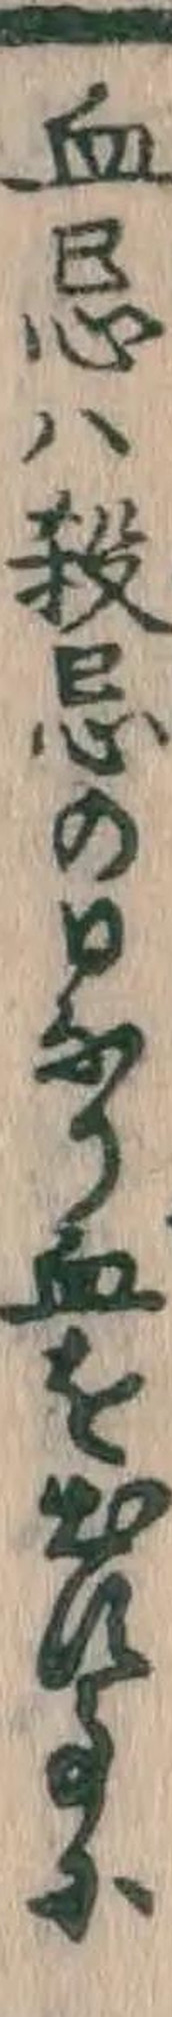血忌は殺忌の日なり血を出す事に
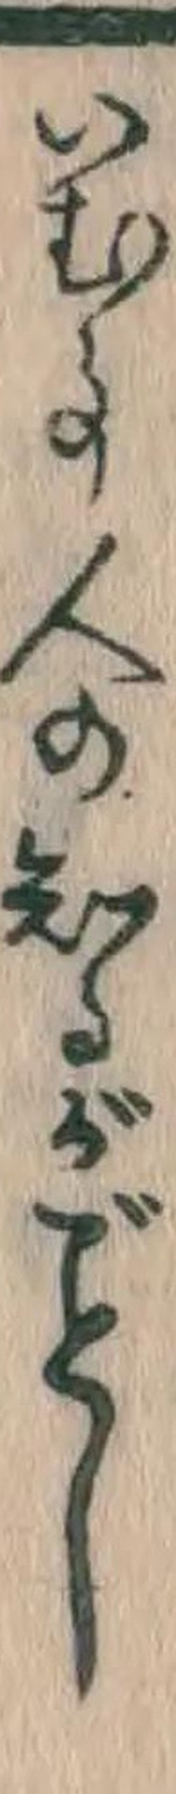いむ事人の知るがごとし
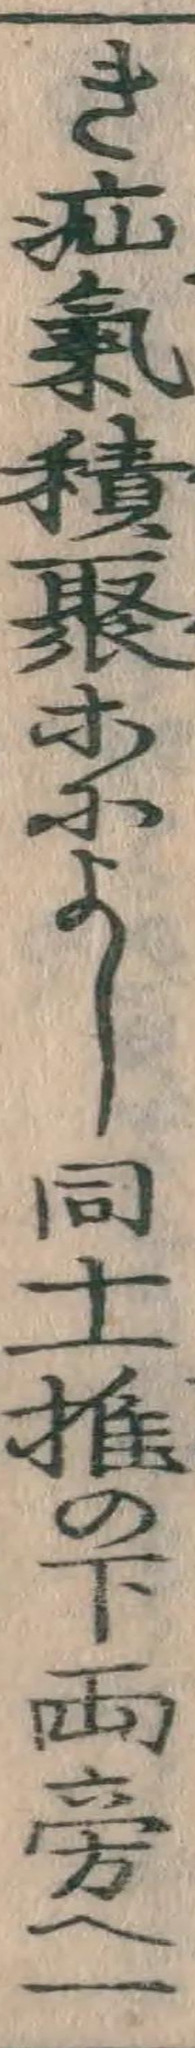き疝気積聚等によし同十一椎の下両旁へ一
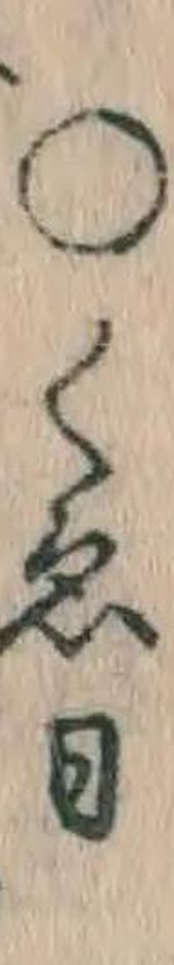○くゑ日
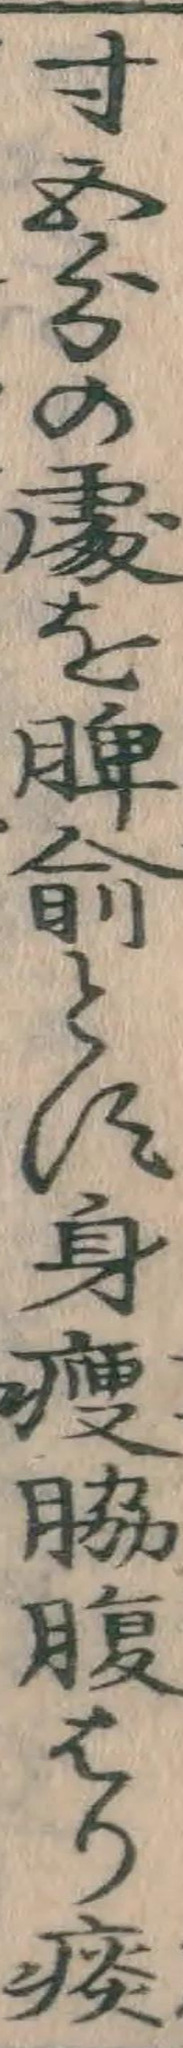寸五分の処を脾兪とす身痩脇腹はり痰
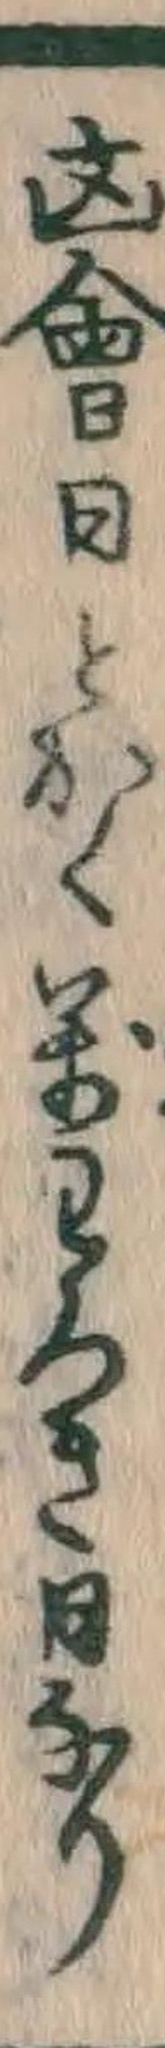凶会日とかく万わろき日なり
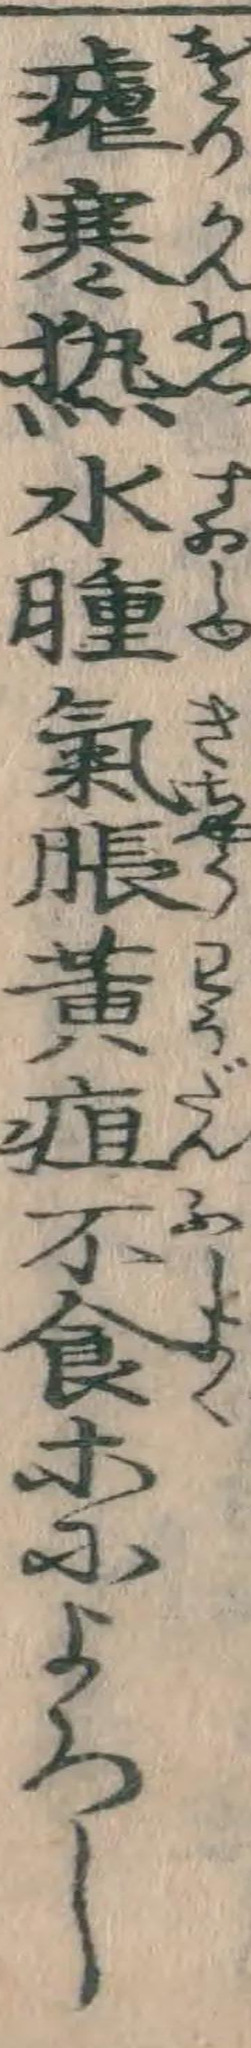瘧寒熱水腫気脹黄疸不食等によろし
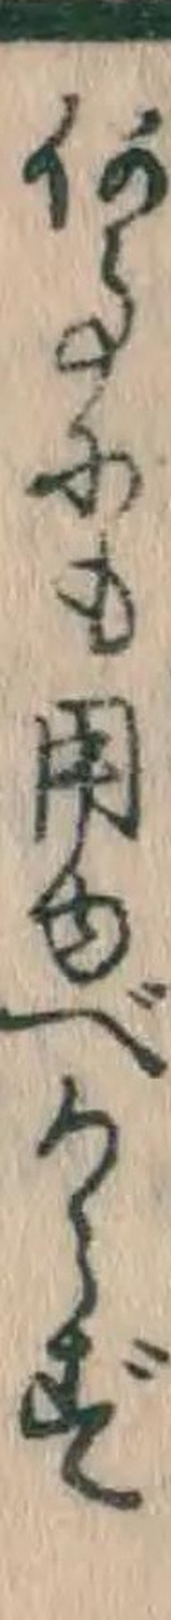何事にも用ゆべからず
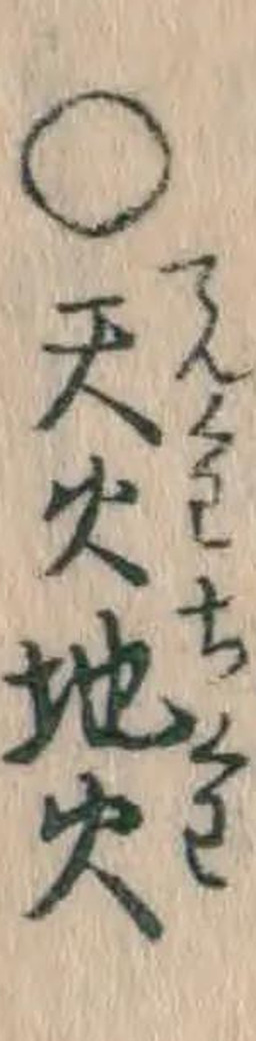○天火地火
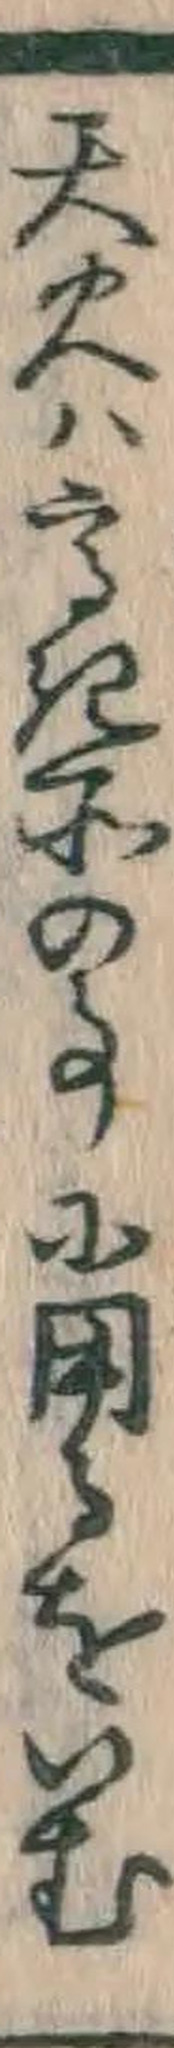天火は高き所の事に用るをいむ
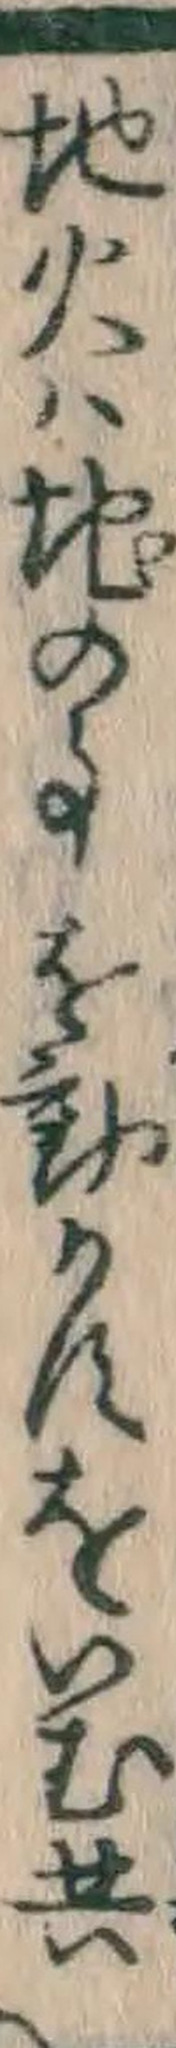地火は地の事を動かすをいむ共
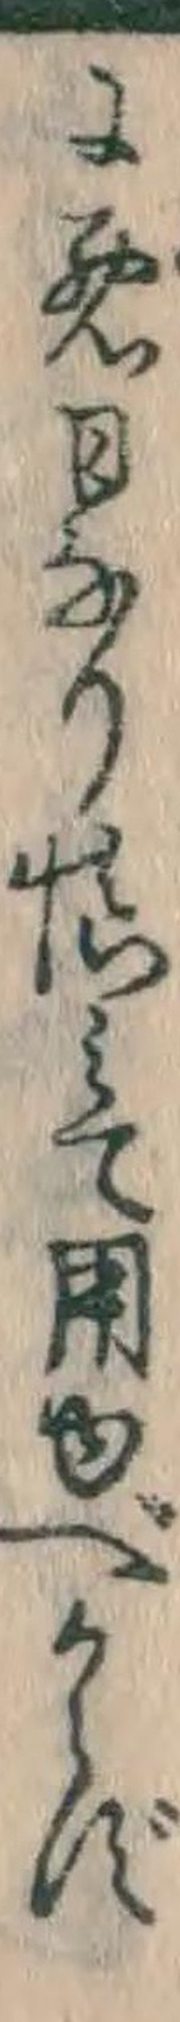に悪日なり慎みて用ゆべからず
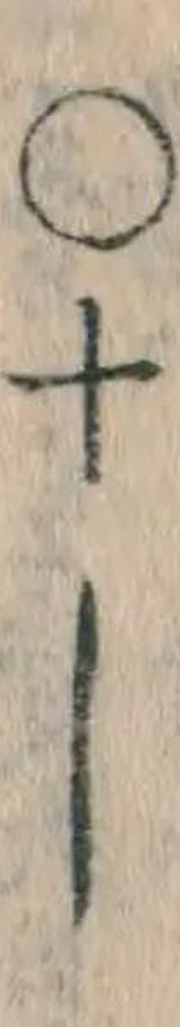○十し
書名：広益秘事大全 3巻. [4]
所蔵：国立国会図書館 National Diet Library, JAPAN
